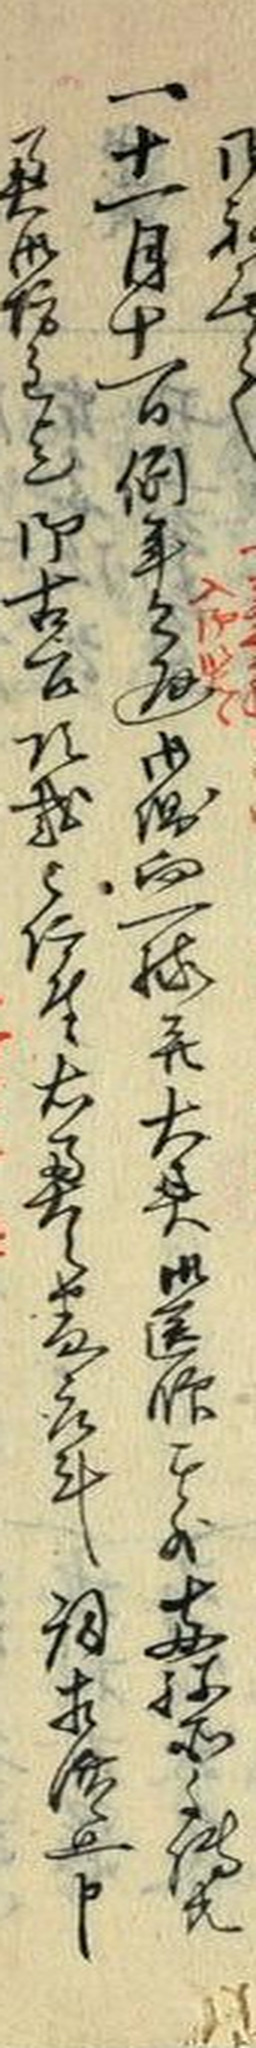奥御坊主迄御古召頂戴被仰付候右奥之番取計調相済候上申
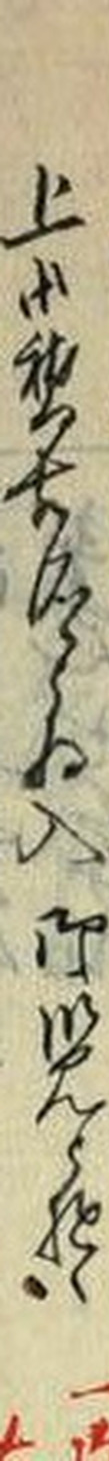上御稽古所へ被為入御覧被遊候
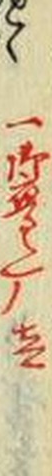一御鷹之雁壱
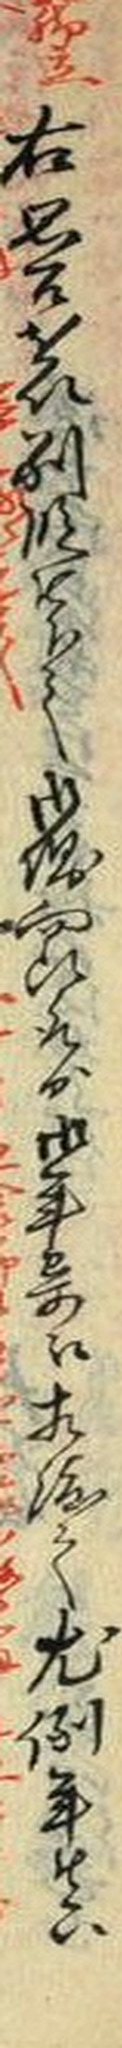右思召を以別段被下之御側向頭取ゟ御年寄江相渡之尤例年被下
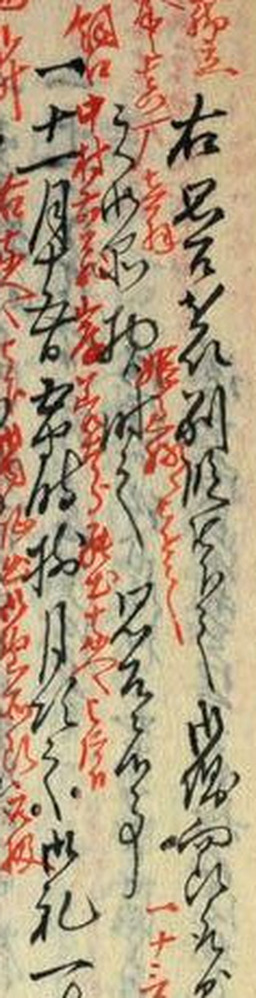之御品物ハ時之思召ニ候事
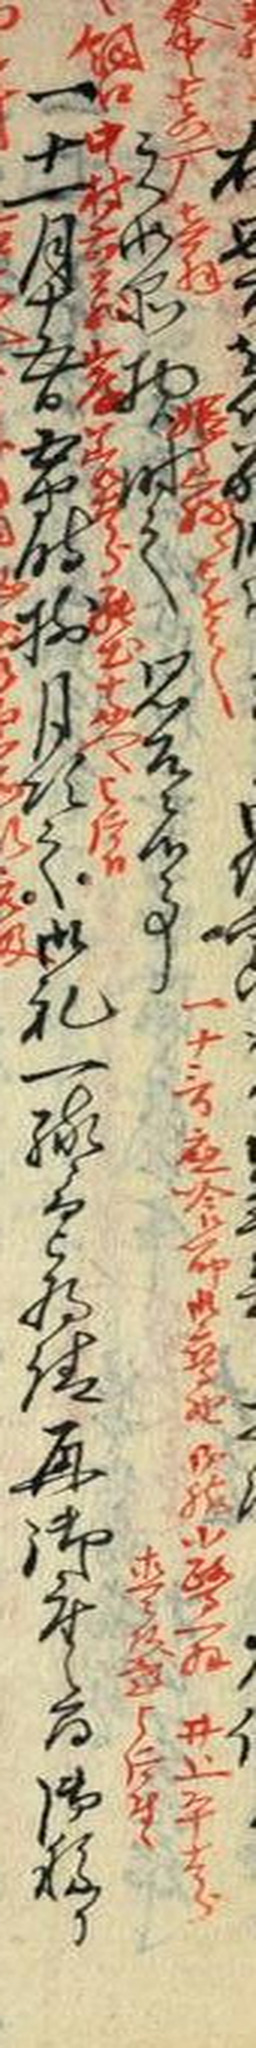一十一月十五日五半時揃月次之御礼一統ニ而被為請再御座之間御移り
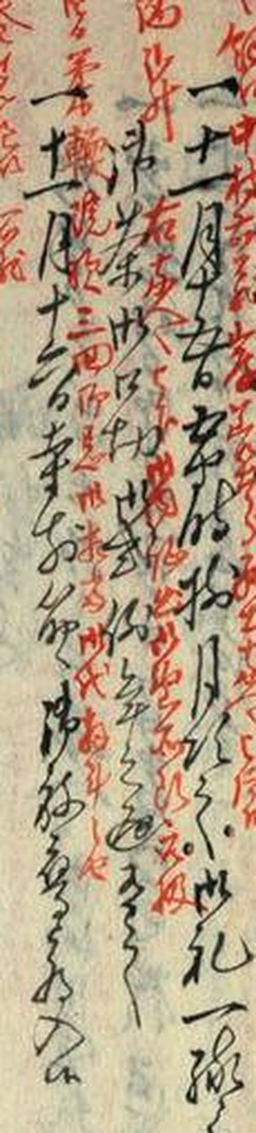御茶御口切御式例年之通有之
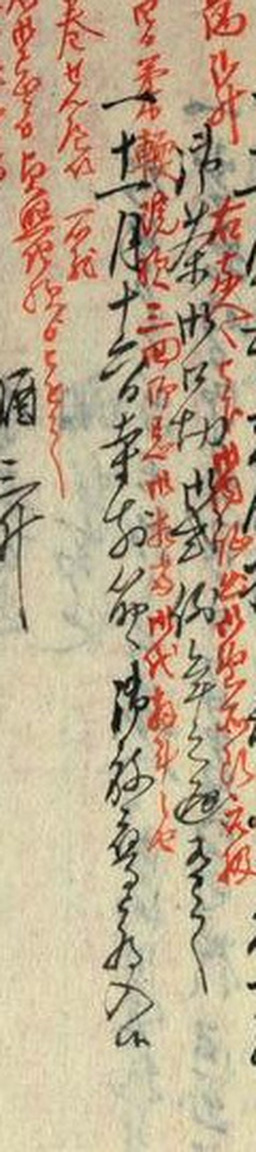一十一月十六日寺前筋へ御放鷹被為入候
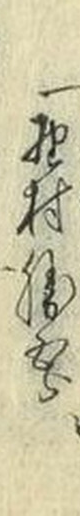野村勝五郎江
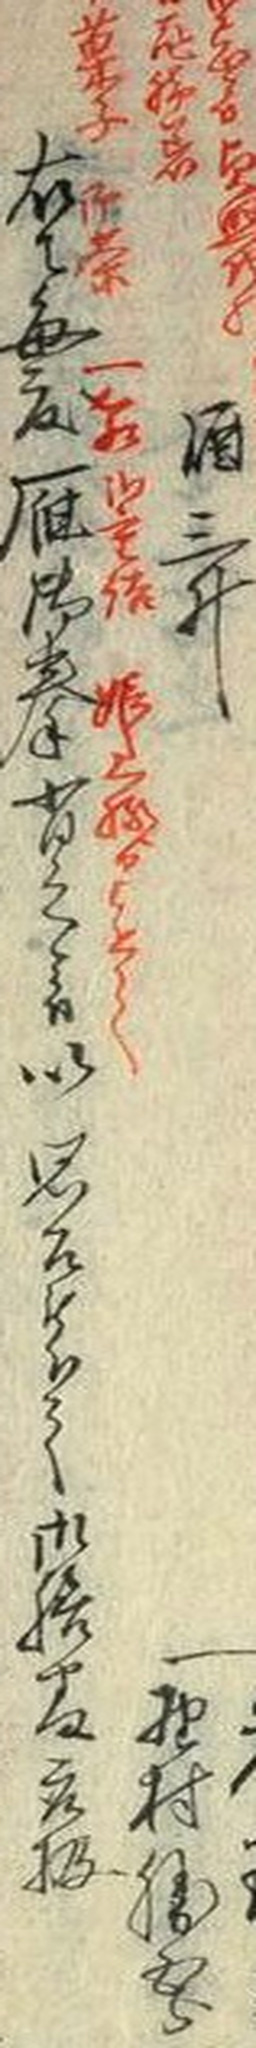右者毎度雁御拳有之候ニ付以思召被下之御膳番取扱
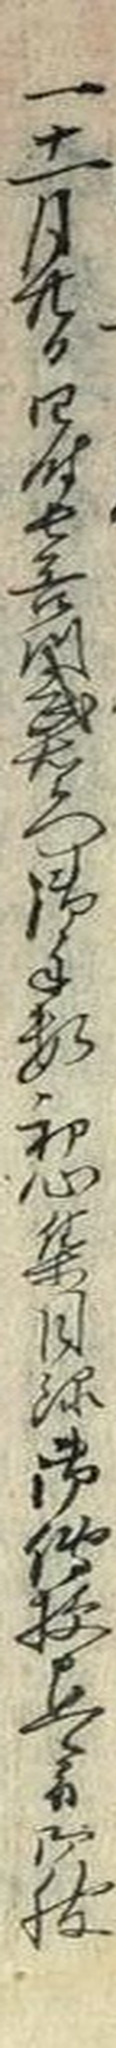一十一月廿日四時長谷川武右衛門御手数初心集目録御伝授申上候ニ付御服
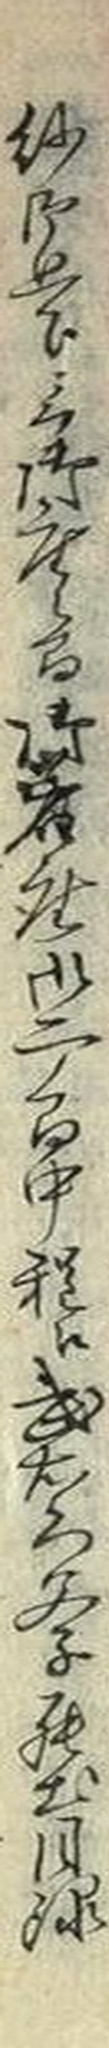紗御上下ニ而御座之間御着座御二ノ間中程江武右衛門父子罷出目録
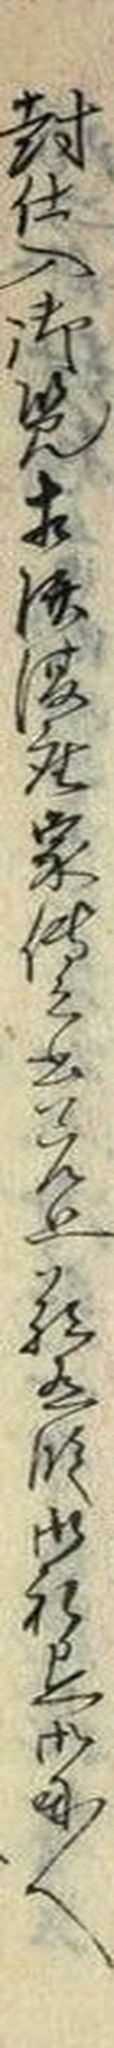封仕入御覧相済復座家伝之書差上難有段御礼申上御用人
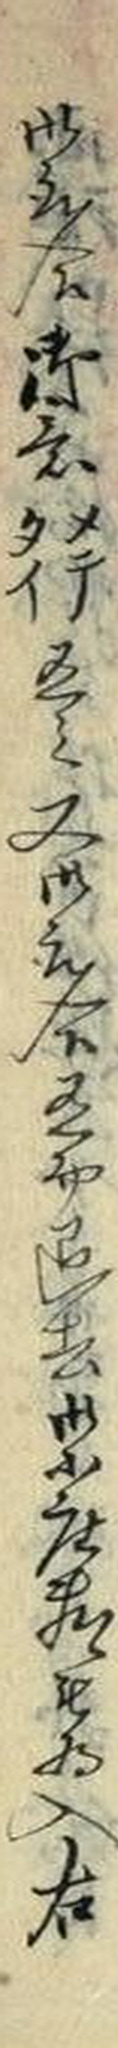タイ有之又御取合有而退去御小座敷へ被為入右

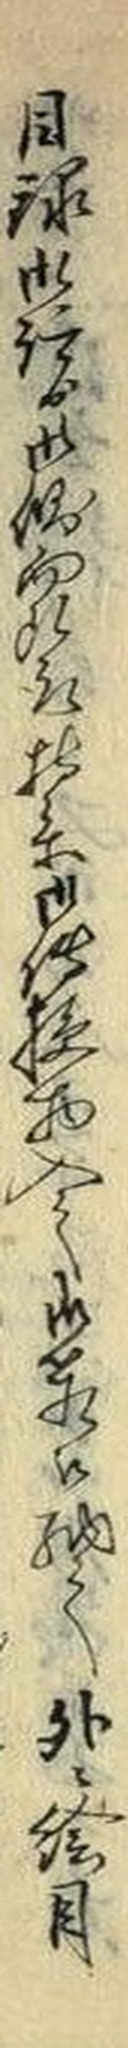目録御跡ゟ御側向頭取持参御伝授物入之御箱江納之外ニ絵目
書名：少傅日録抄（斉承付側向頭取日記、在国）
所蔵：福井県文書館 Fukui Prefectural Archives
